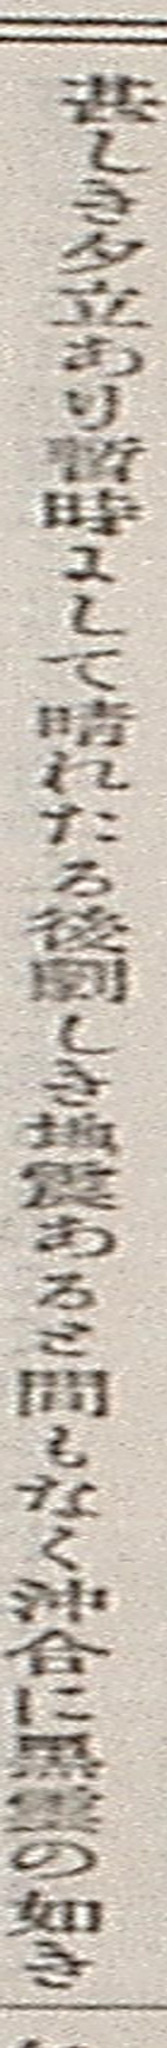甚しき夕立あり暫時にして晴れたる後劇しき地震あると間もなく沖合に黒雲の如き
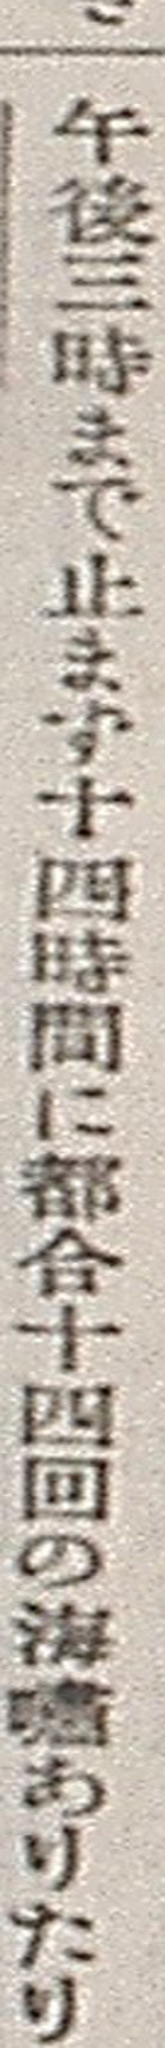午後三時まで止まず十四時間に都合十四回の海嘯ありたり
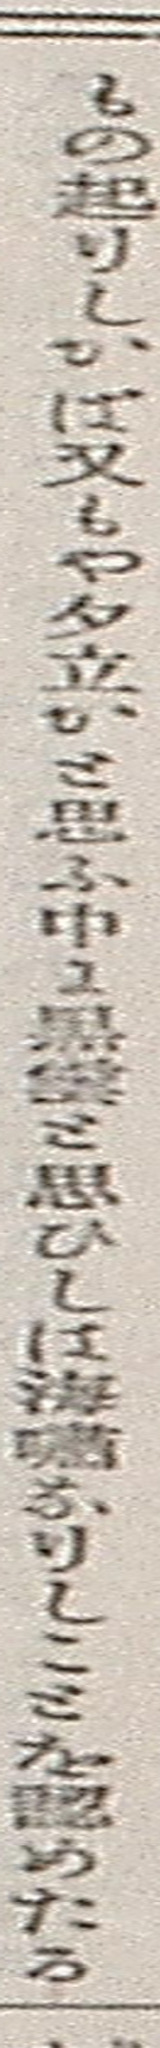もの起りしかば又もや夕立かと思ふ中に黒雲と思ひしは海嘯なりしことを認めたる
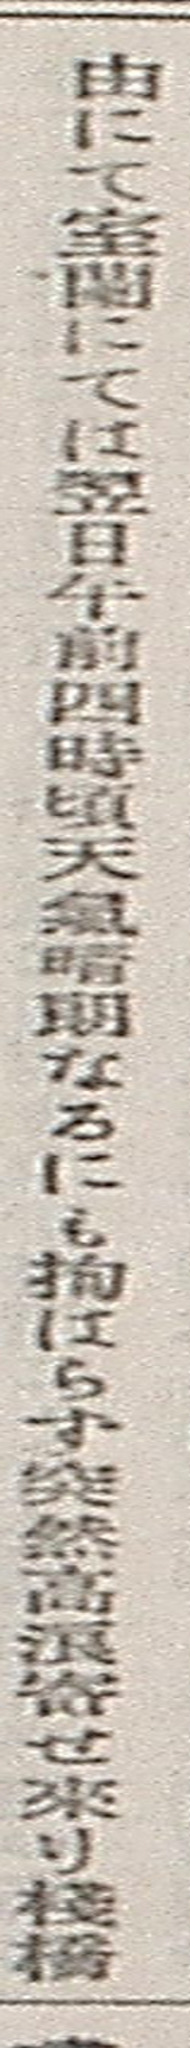由にて室蘭にては翌日午前四時頃天気晴朗なるにも拘はらず突然高浪寄せ来り桟橋
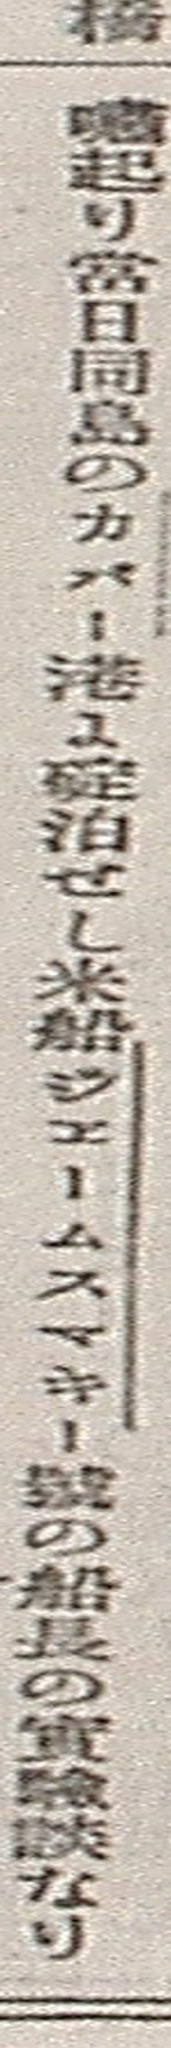嘯起り当日同島のカバー港に碇泊せし米船ジェームスマキー号の船長の実験談なり
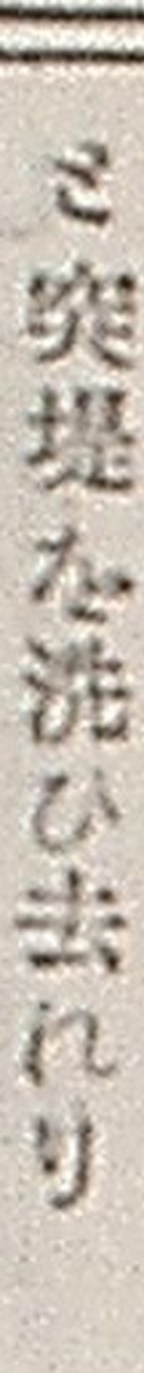と突堤を洗ひ去れり
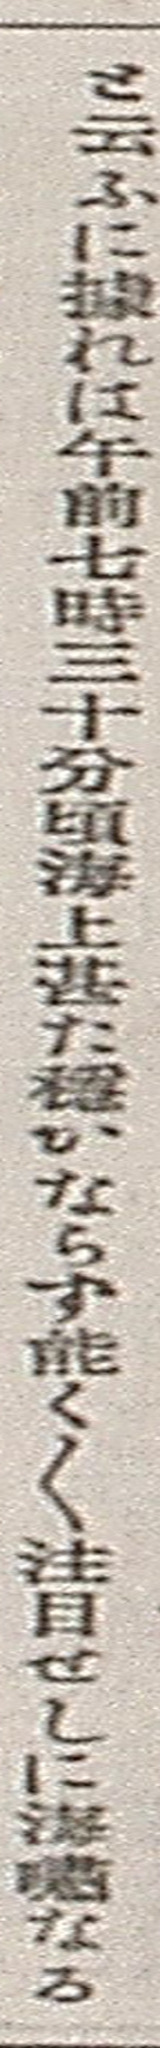と云ふに拠れは午前七時三十分頃海上甚た穏かならず能く〳〵注目せしに海嘯なる
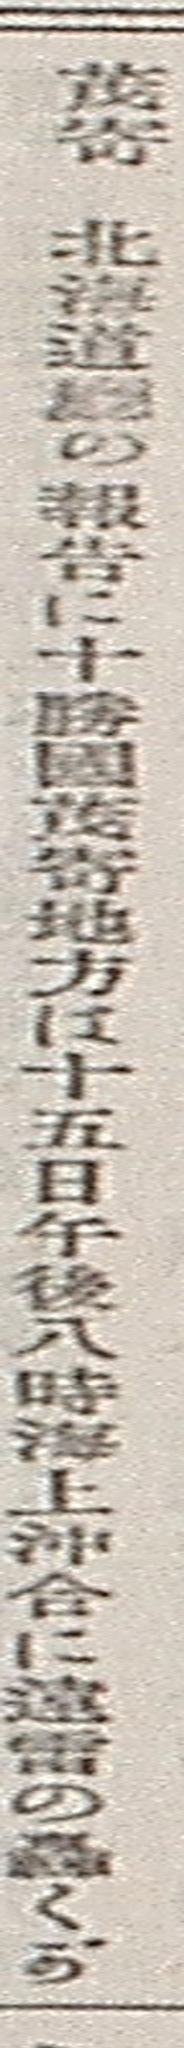茂寄北海道庁の報告に十勝国茂寄地方は十五日午後八時海上沖合に遠雷の轟くが
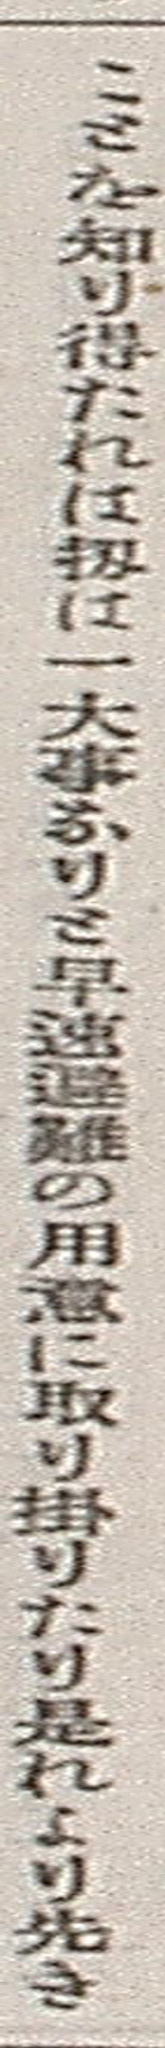ことを知り得たれば扨は一大事なりと早速避難の用意に取り掛りたり是れより先き
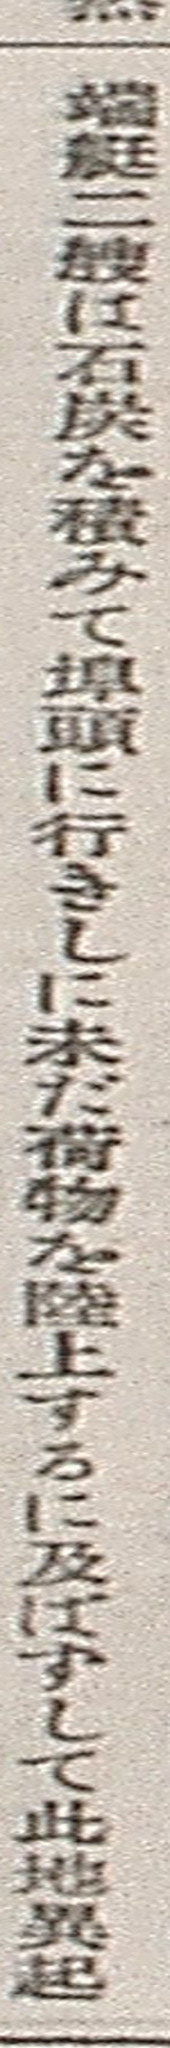端艇二艘は石炭を積みて埠頭に行きしに未だ荷物を陸上するに及ばずして此地異起
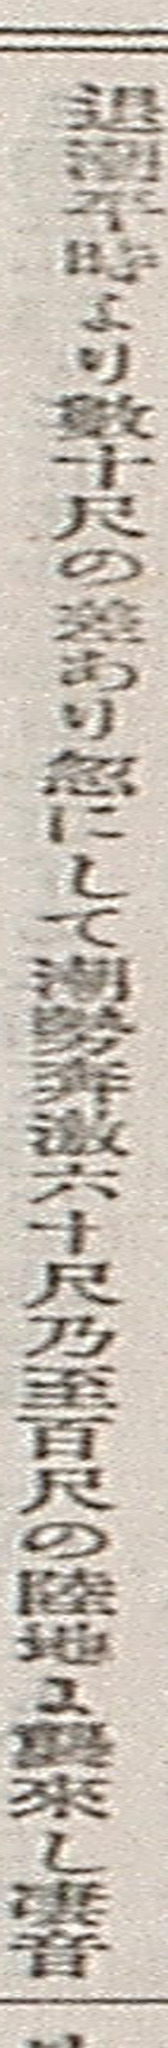如き響を聞き仝時に微震あり忽にして潮勢奔激六十尺乃至百尺の陸地に襲来し凄音
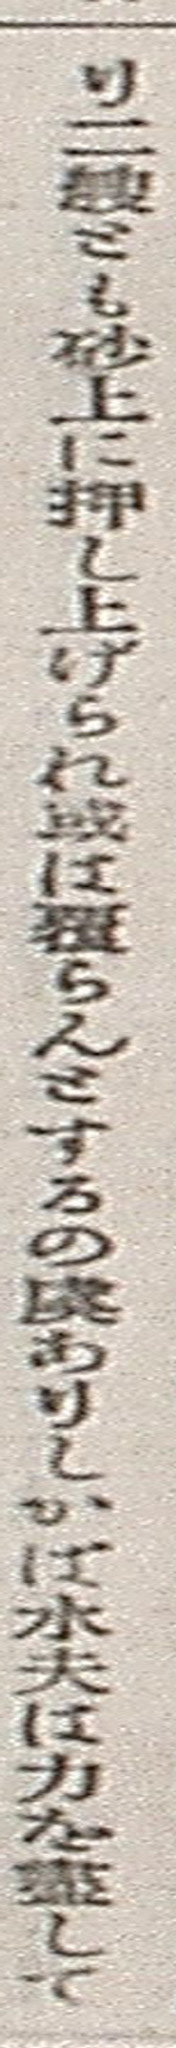り二艘とも砂上に押し上げられ或は覆らんとするの虔ありしかば水夫は力を尽して
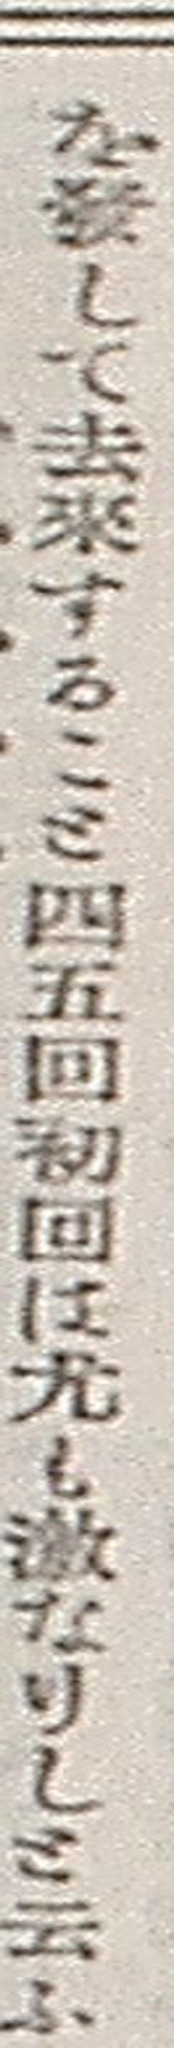を発して去来すること四五回初回は尤も激なりしと云ふ
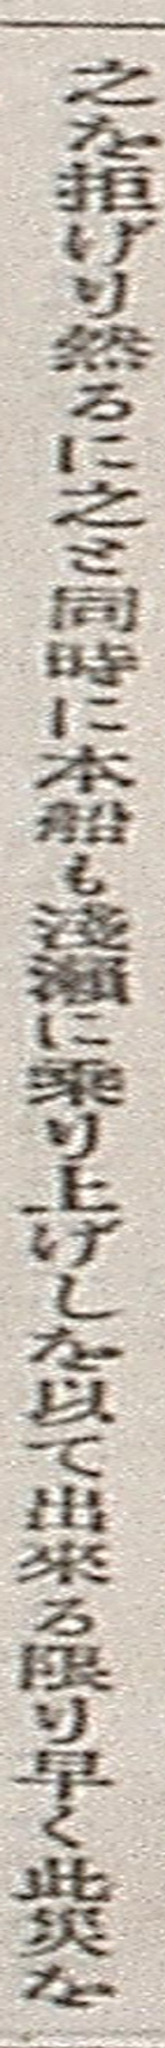之を拒げり然るに之と同時に本船も浅瀬に乗り上げしを以て出来る限り早く此災を
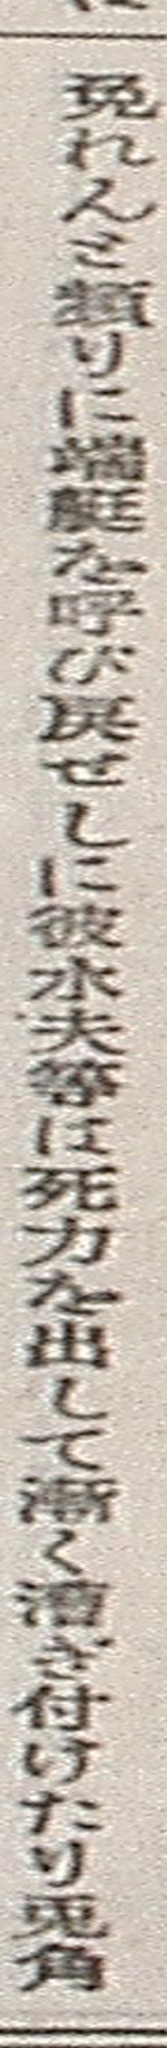免れんと頻りに端艇を呼び戻せしに彼水夫等は死力を出して漸く漕ぎ付けたり兎角
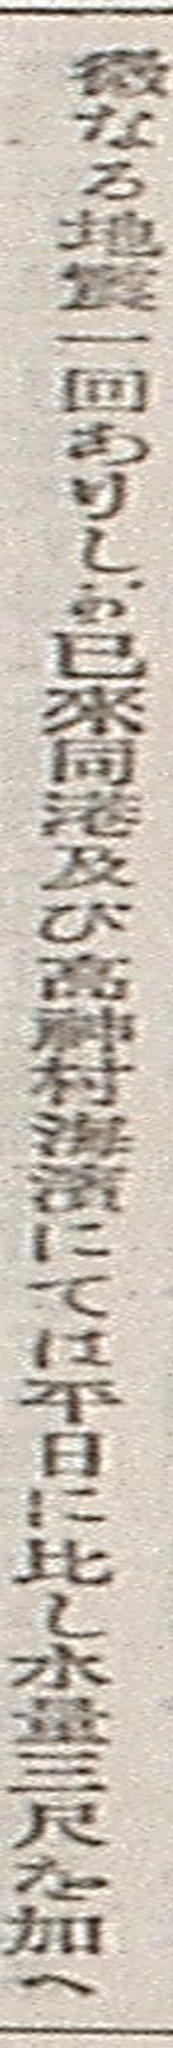微なる地震一回ありしが已来同港及び高神村海浜にては平日に比し水量三尺を加へ
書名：風俗畫報臨時増刊第百十九號　大海嘯被害録（中）
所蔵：東京大学地震研究所図書室 Earthquake Research Institute Library, The University of Tokyo, JAPAN
